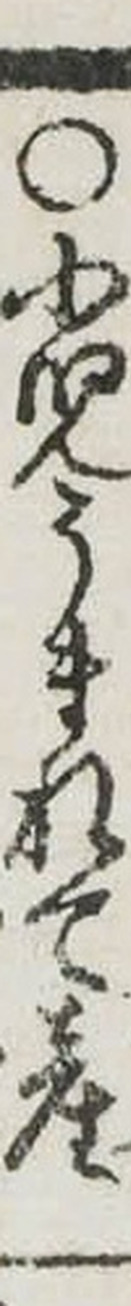○小児うまれて産
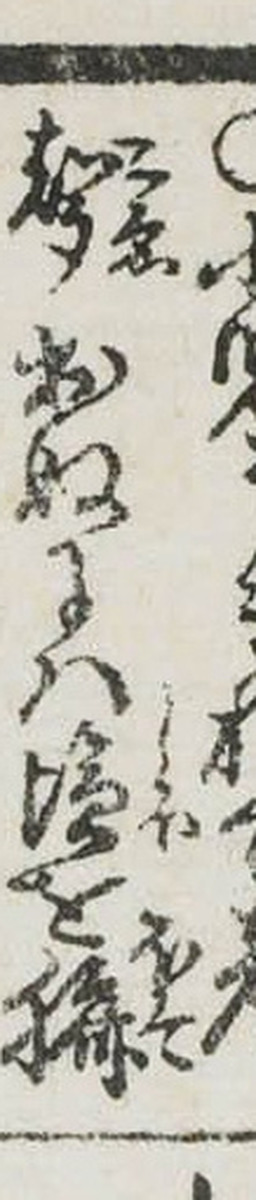声出ぬには塩を臍
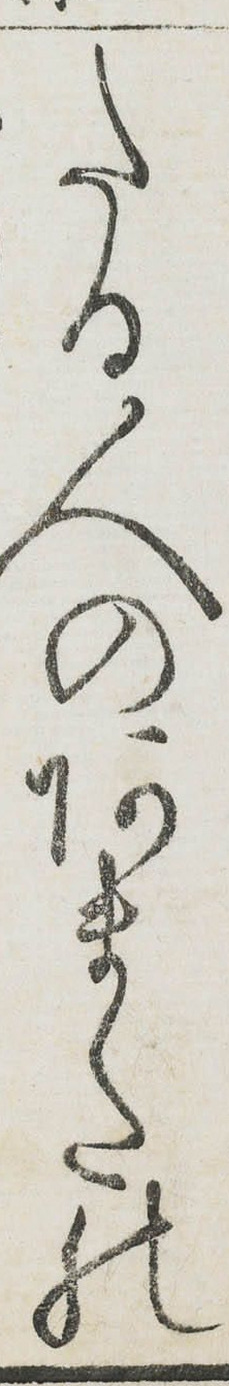たる人のあまたの
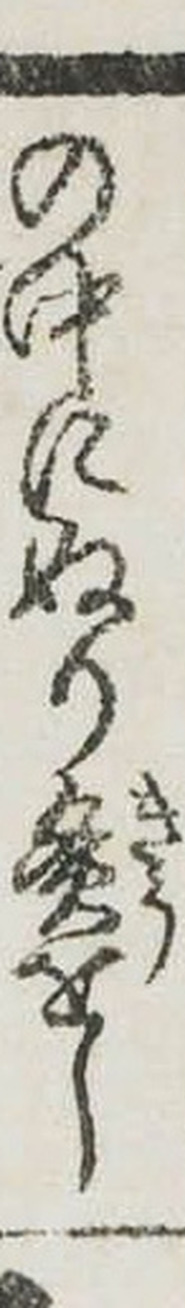の中にぬり灸をし
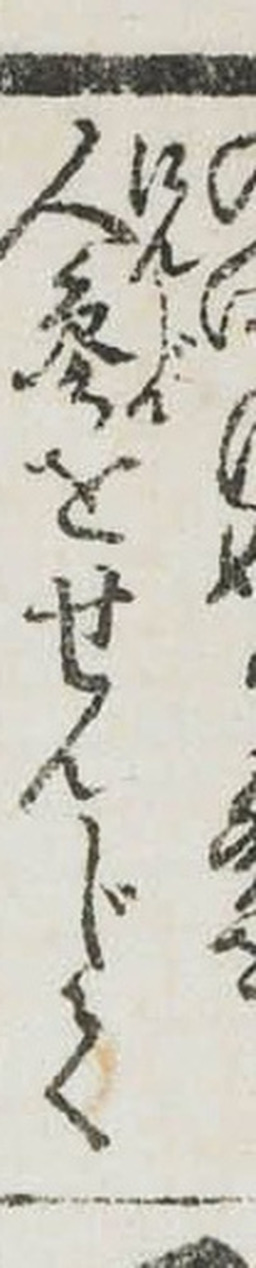人参をせんじて
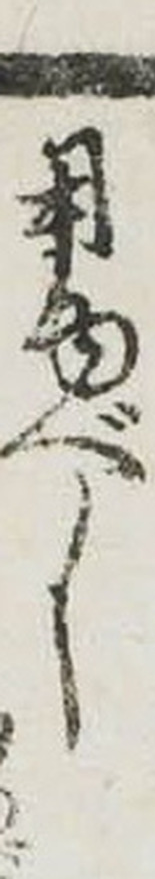用ゆべし
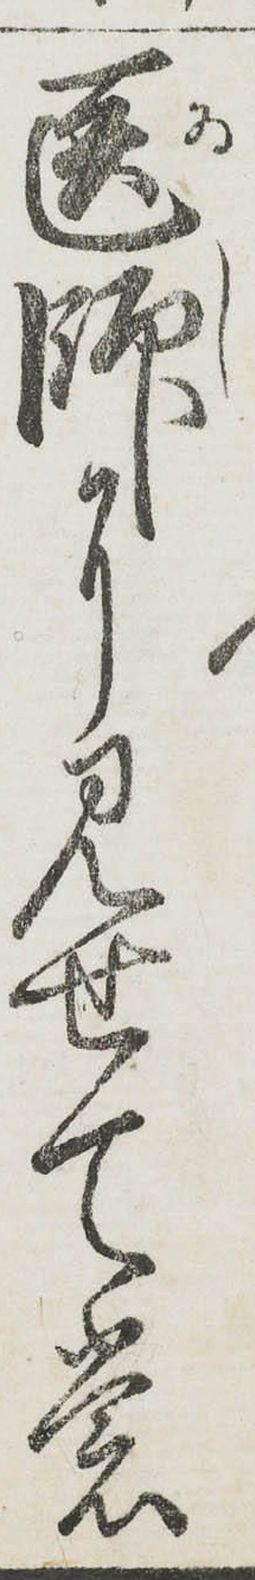医師に見せても
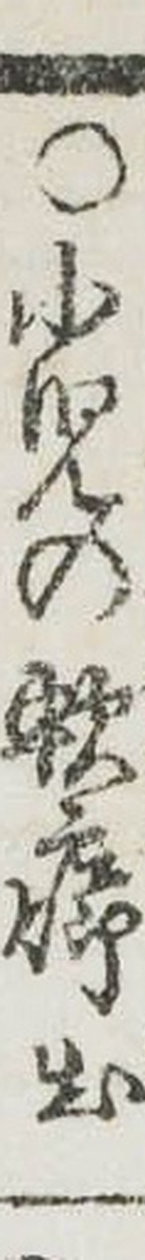○小児の軟癤出
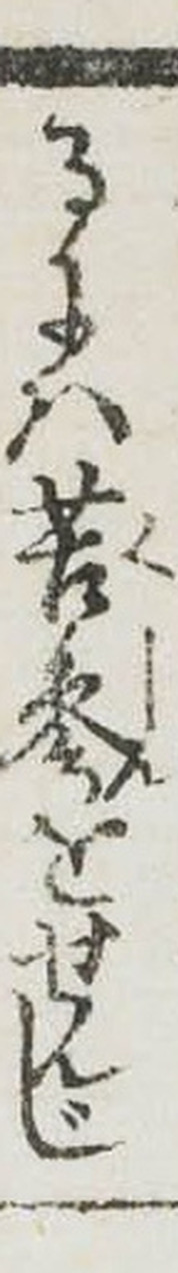るには苦参をせんじ
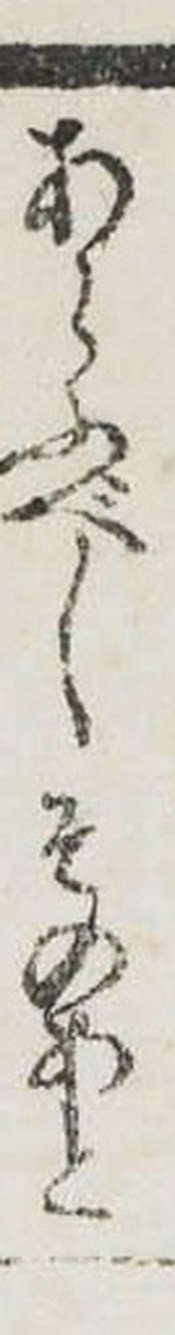あらふべしそのあと
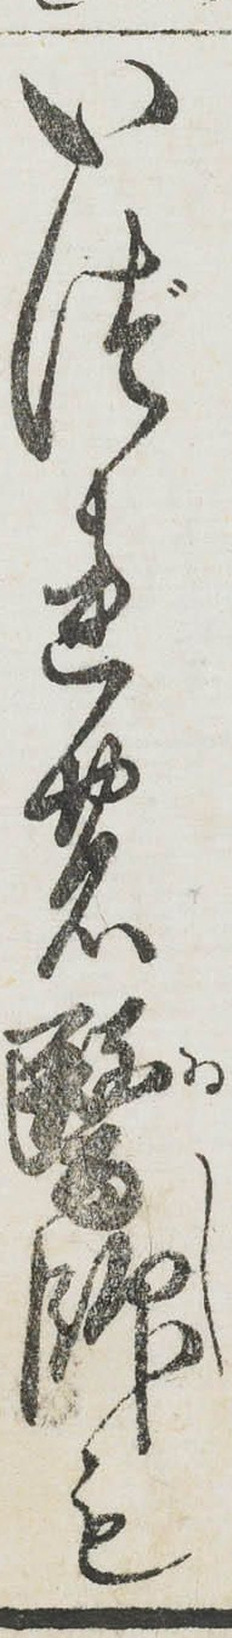いづれの医師も
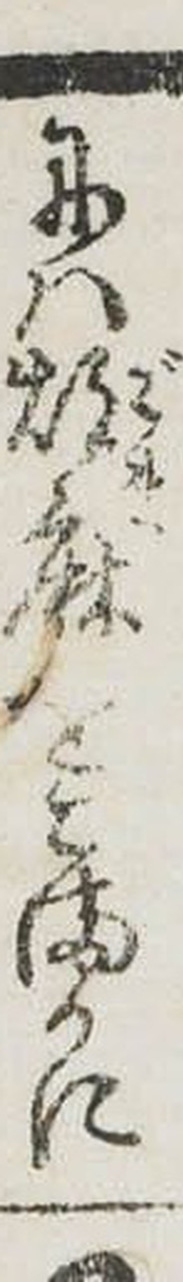には胡麻をこまかに
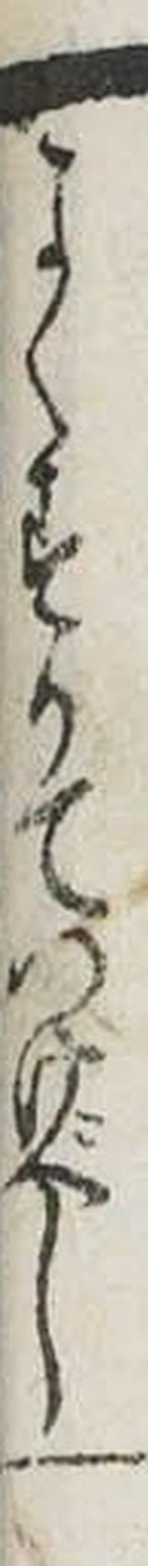よくすりてつけべし
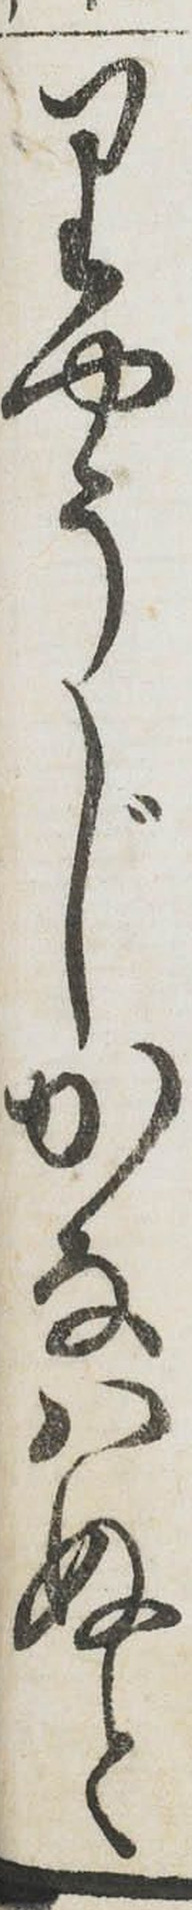りやうじかなはぬと
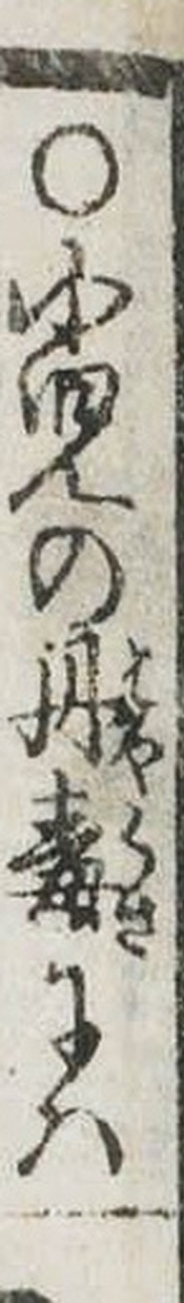○小児の丹毒には
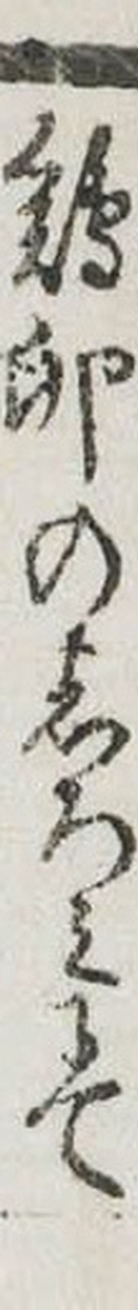鶏卵のしろみにて
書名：頭書萬用婦人手紙之文言
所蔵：東京学芸大学教育コンテンツアーカイブ
